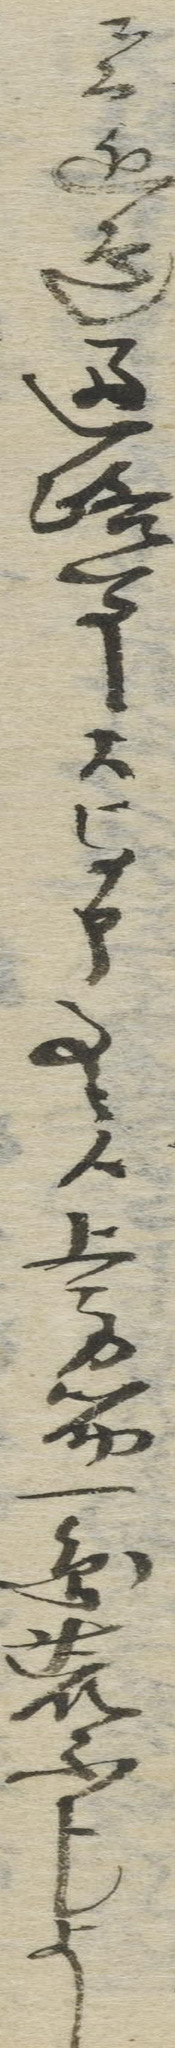二而近辺通路いたしふじう？申事二候上方筋一圓荒不申候よし
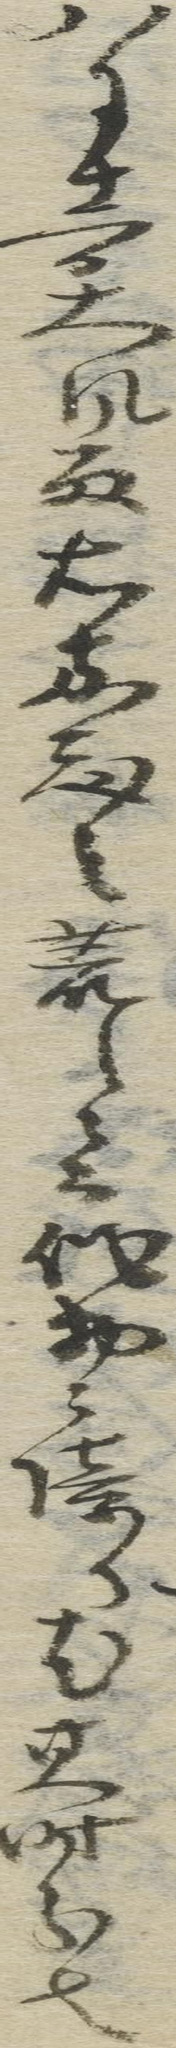八月十二日大風雨右両度之荒し二而作物二障り尤其時分は
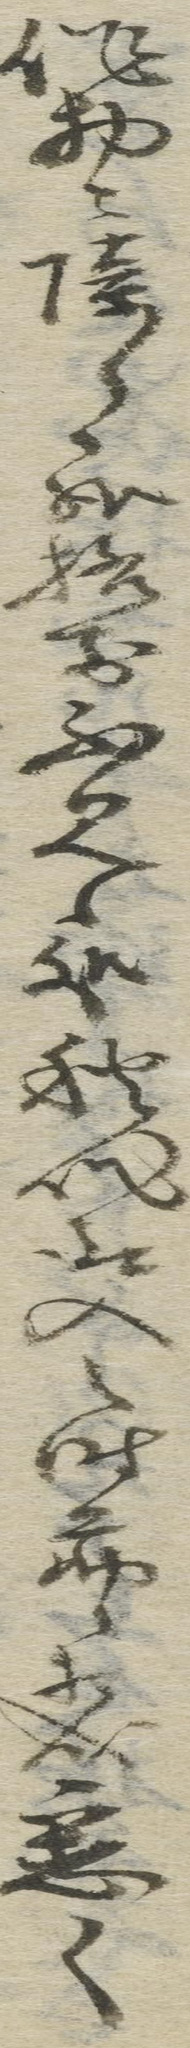作物二障り候様格別不見候所秋作取入之時節二相成悉く
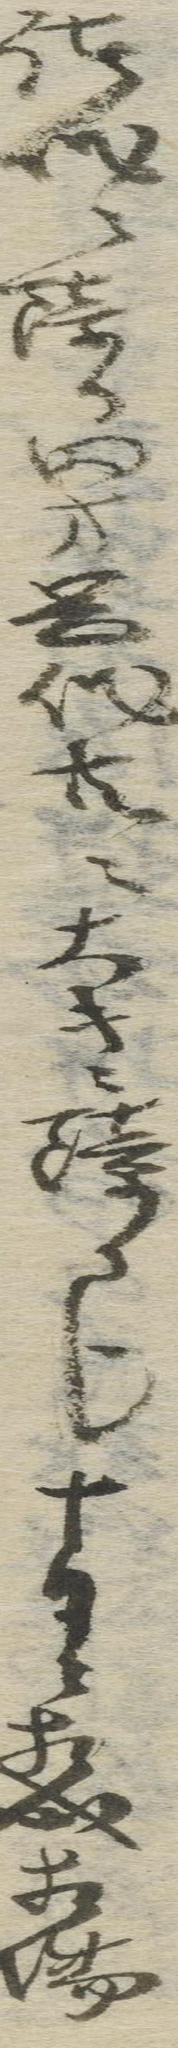諸作二障り田方岡作共二大キ二障り申候十月二相成相場
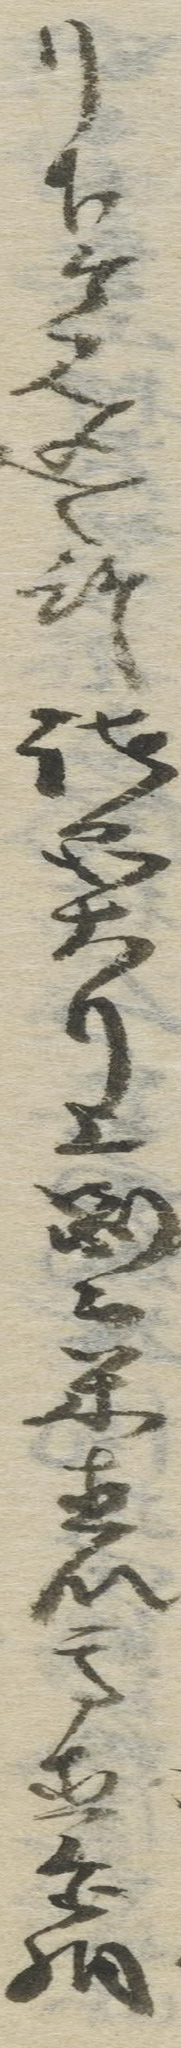引下ヶ見込候所諸品大引上別而米直段高直金調
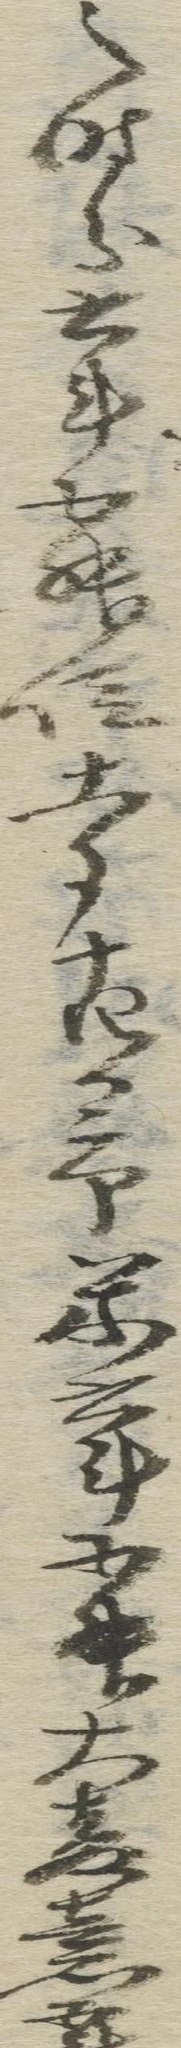之時分六斗七升位十一月十四日市米六斗五升大麦壱石五斗
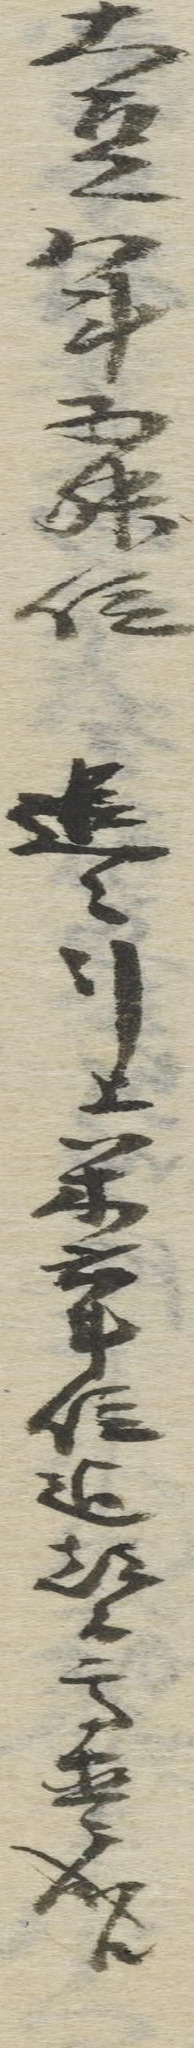大豆八斗五升位追々引上米六斗位迄都而高直二相成候
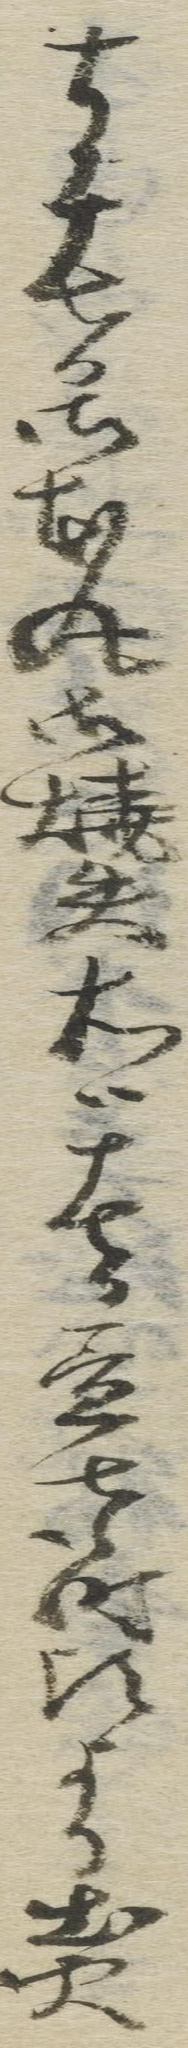十月十七日ゟ御本丸御焼失右は十七日昼七ッ時頃より出火
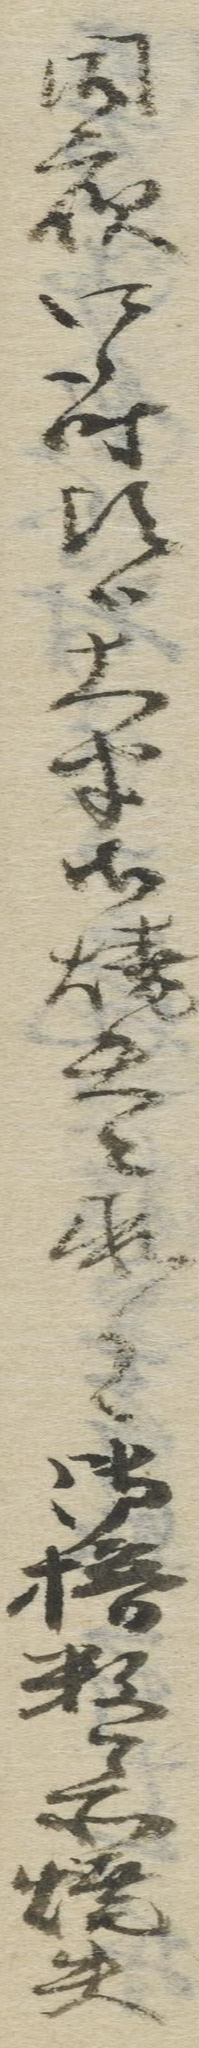同夜四ッ時頃ハ大半御焼失二承候御櫓数ヶ所焼失
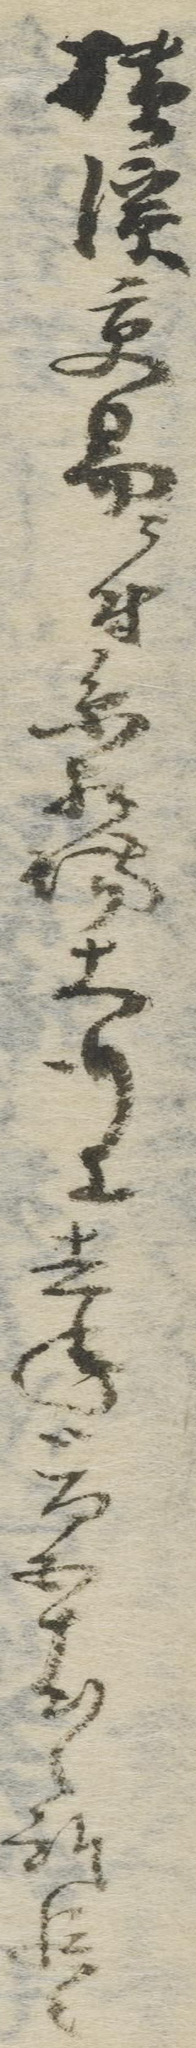横浜交易二付糸相場大引上去年ハ百五十匁之所追々
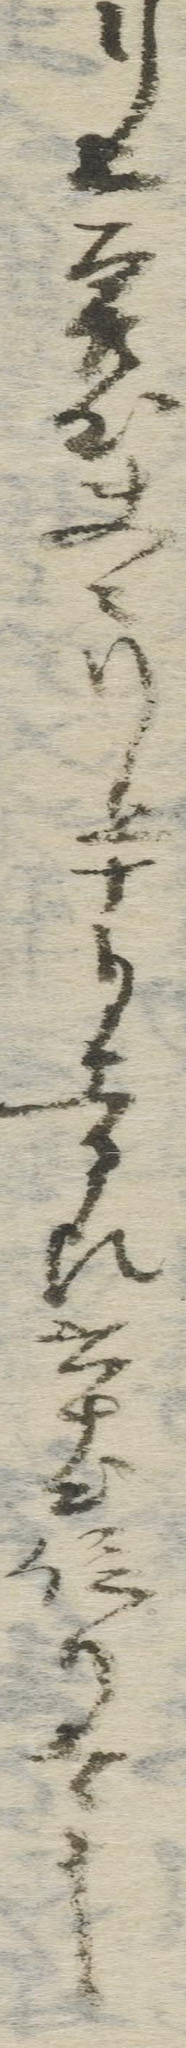引上百廿匁夫々引上十月十一日頃六十匁位引上候よし
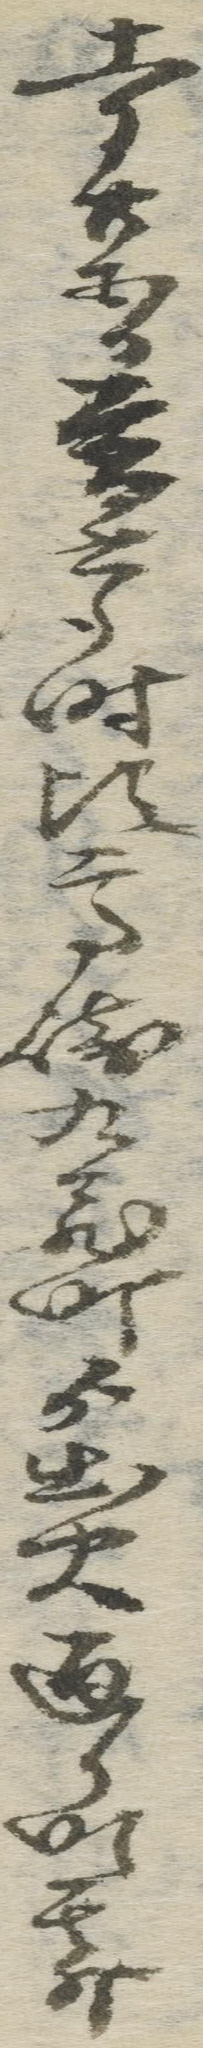十一月廿五日暮六ッ時頃高崎九蔵町ゟ出火通り町其外
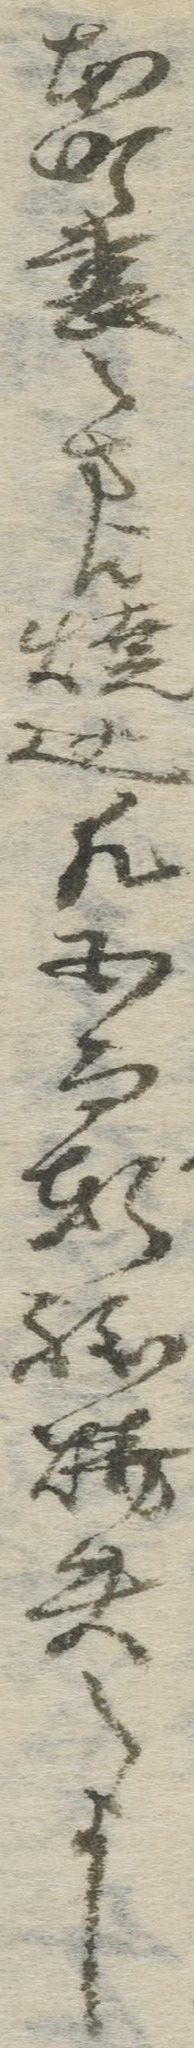本町裏之方江焼込凡五百軒程焼失之よし
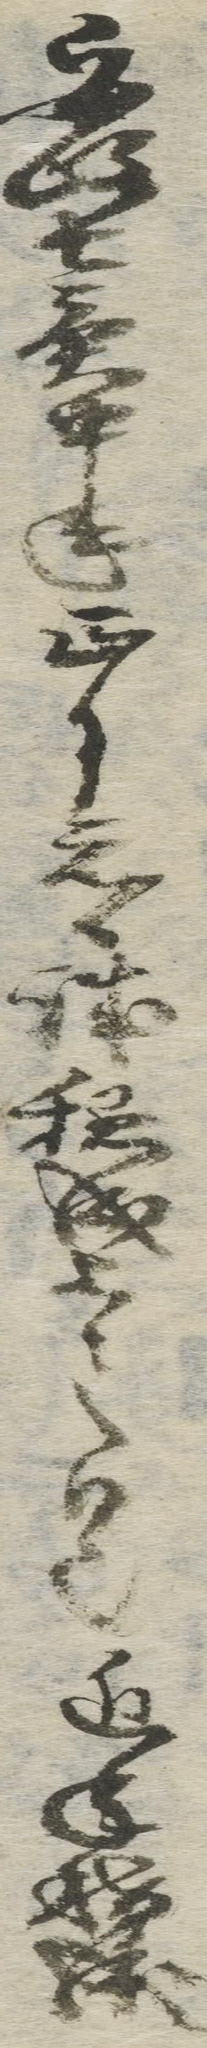安政七庚申年正月元旦誠穏成上々之日也近年稀成
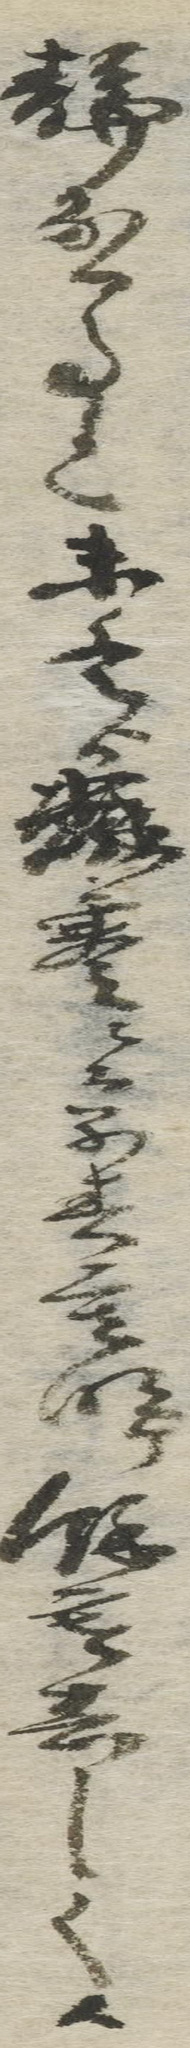静なる事二候未冬ゟ厳寒二而早春寒明ヶ餘寒甚しく候
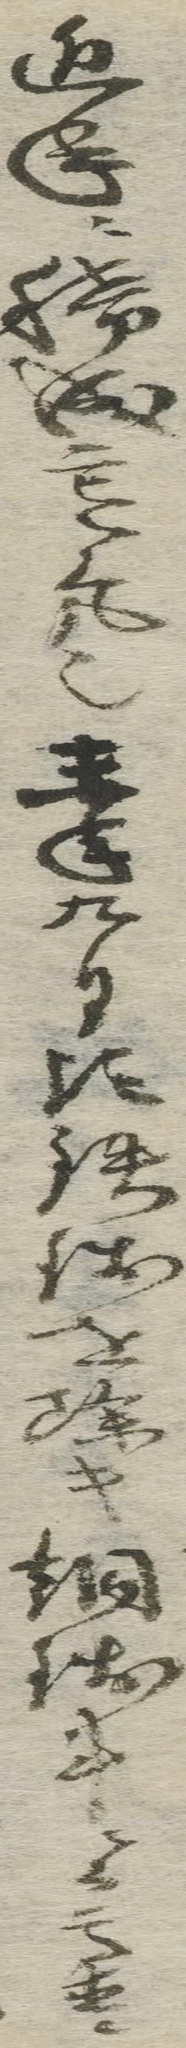近年二稀成寒気二候未年九月頃鉄銭を除キ銅銭計二而高直二
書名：信濃越後　地震書留
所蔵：東京大学地震研究所図書室 Earthquake Research Institute Library, The University of Tokyo, JAPAN
